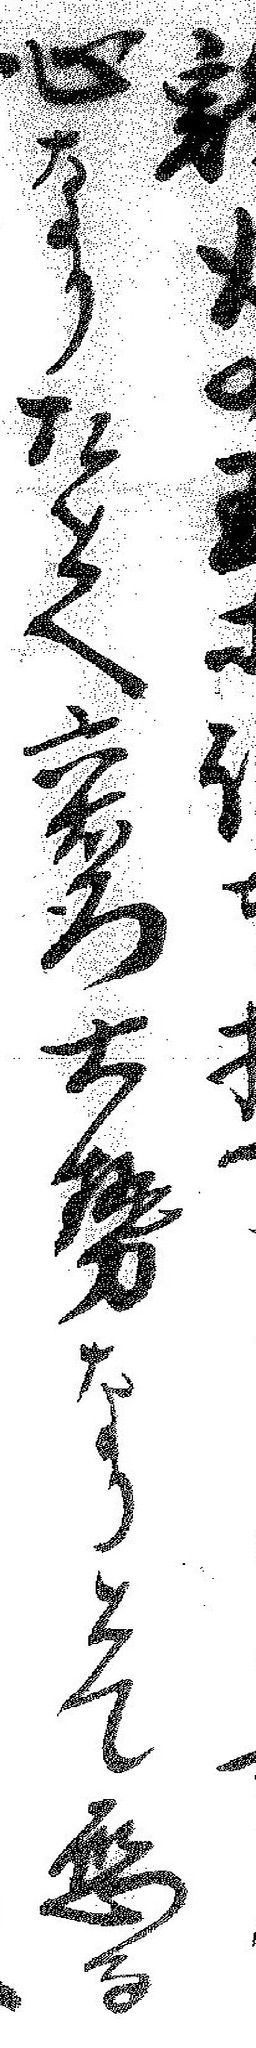心なりたとへ六右衛門大勢なりとて恐る
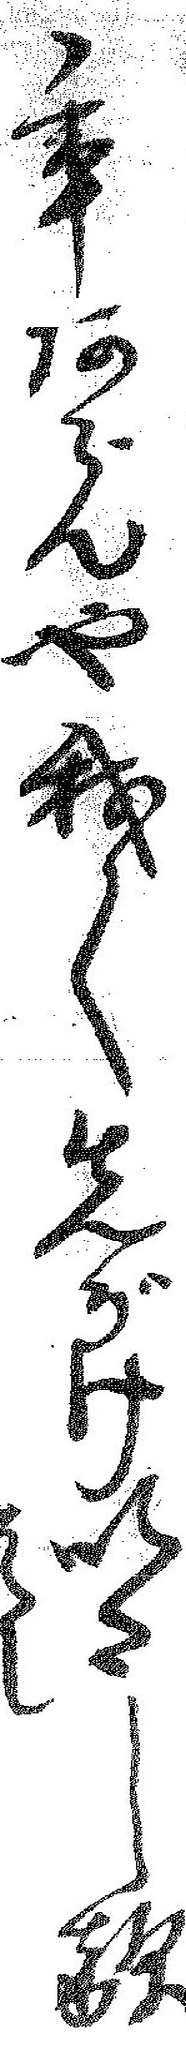ゝ事あらんや我〳〵先がけいたし敵
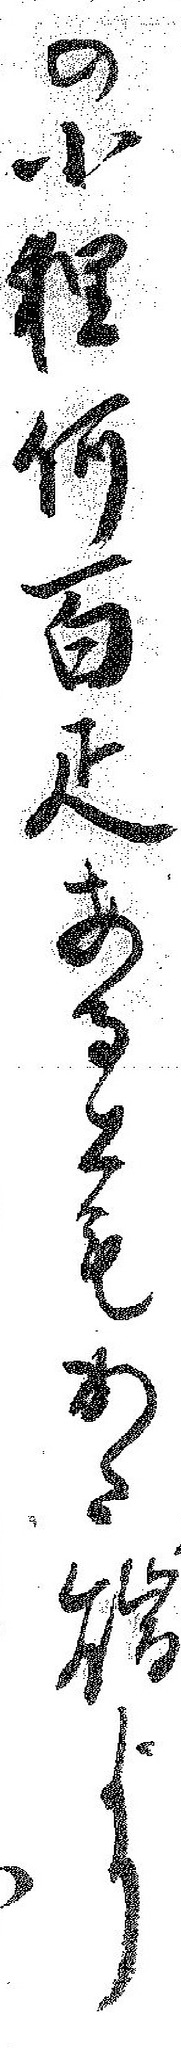の小狸何百疋あるともかた端より
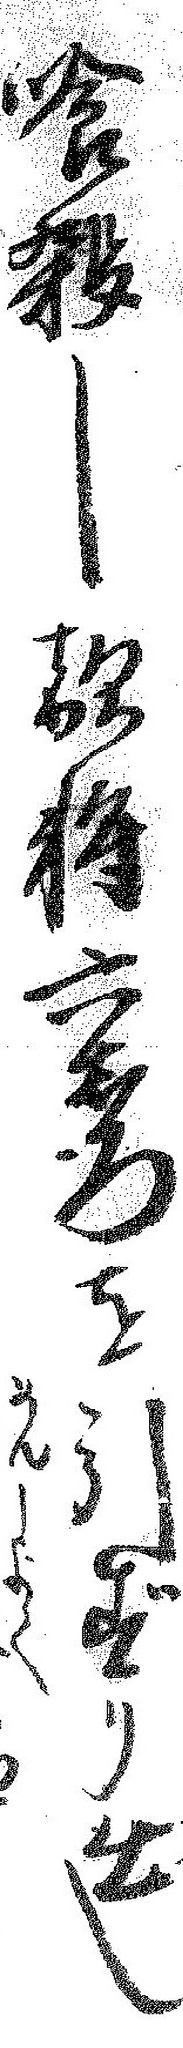喰殺し敵将六右衛門を引ずり出し
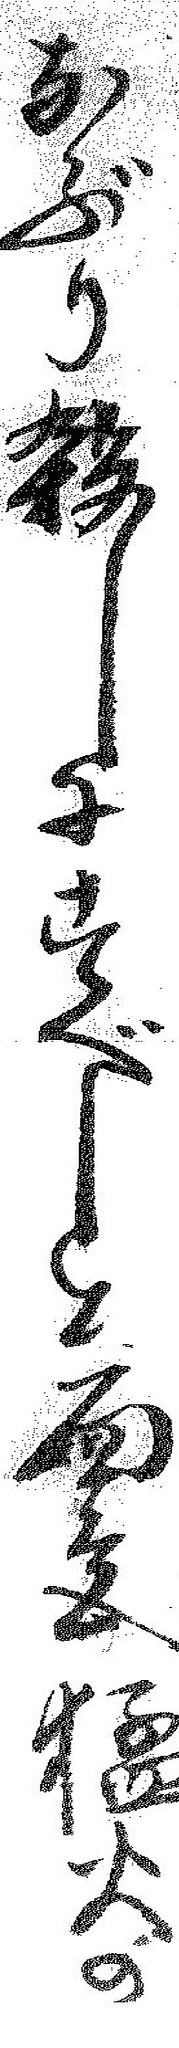なぶり殺しにすべしと面色猛火の
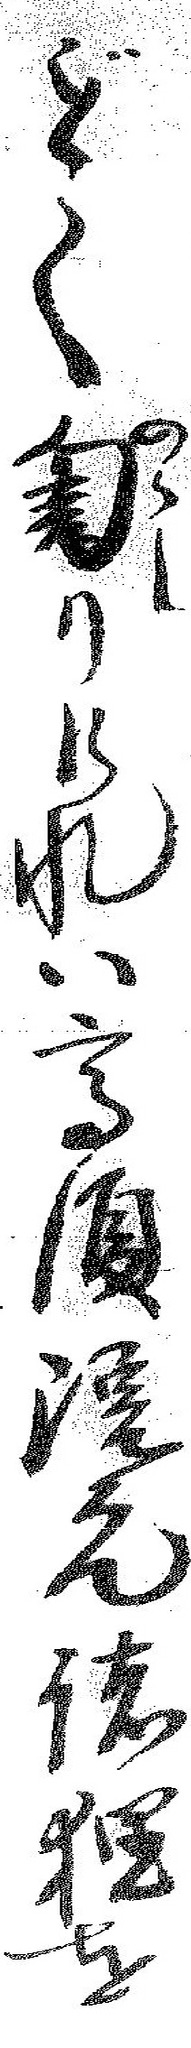ごとく訇りけれは高須院元諸狸を
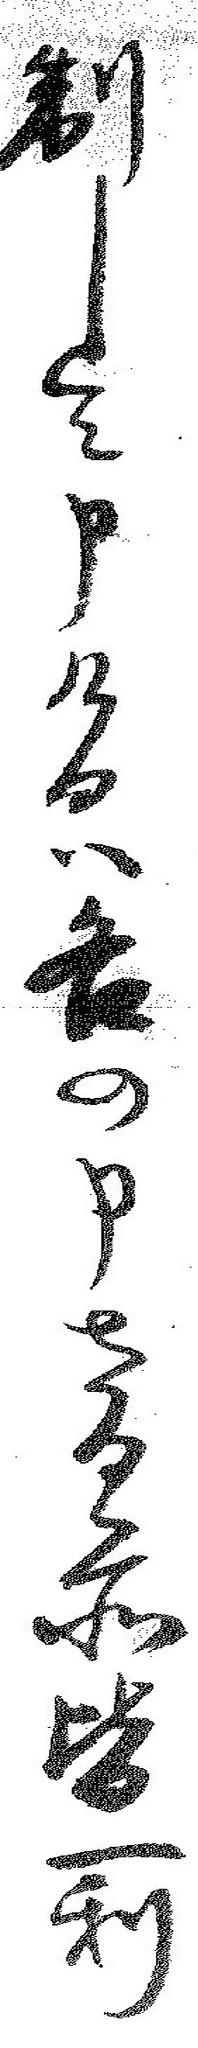制して申けるは各の申さるゝ所皆一利
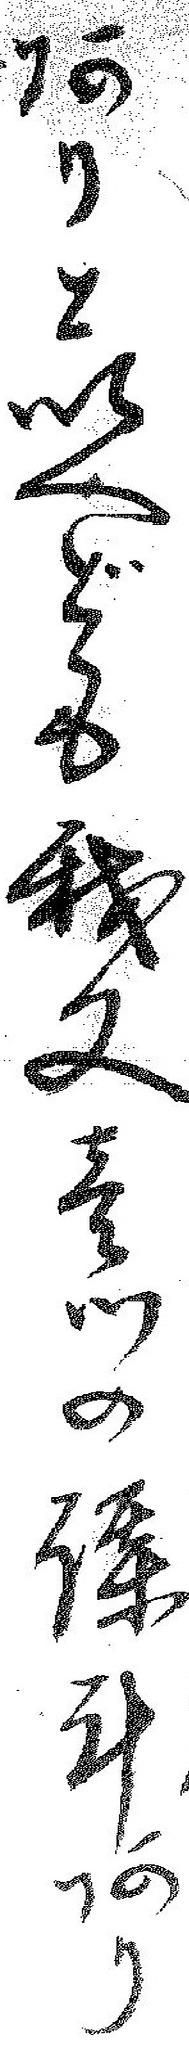ありといへども我又壱ツの謀計あり
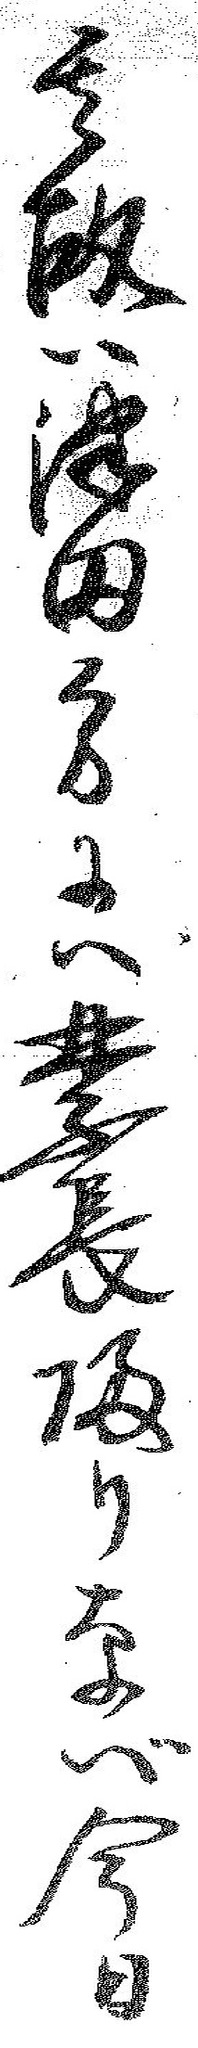其故は津田方には禁長帰りなば今日
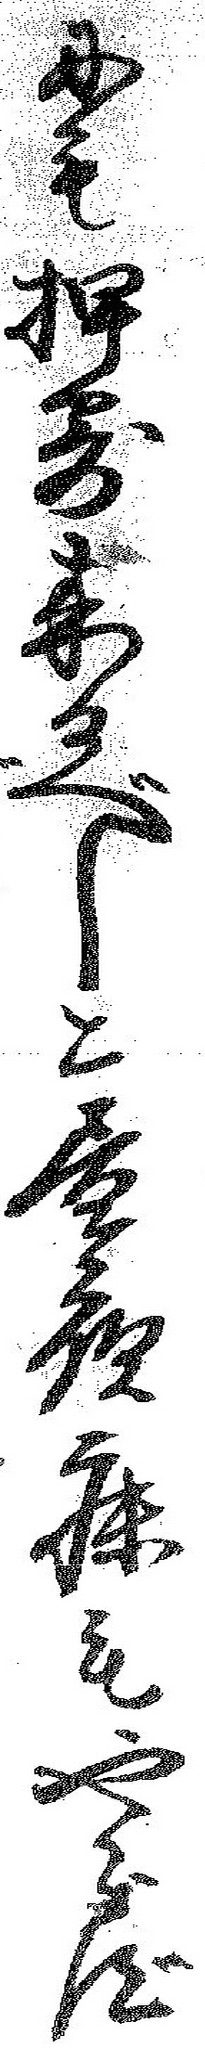にも押寄来るべしと昼夜寐もやらず
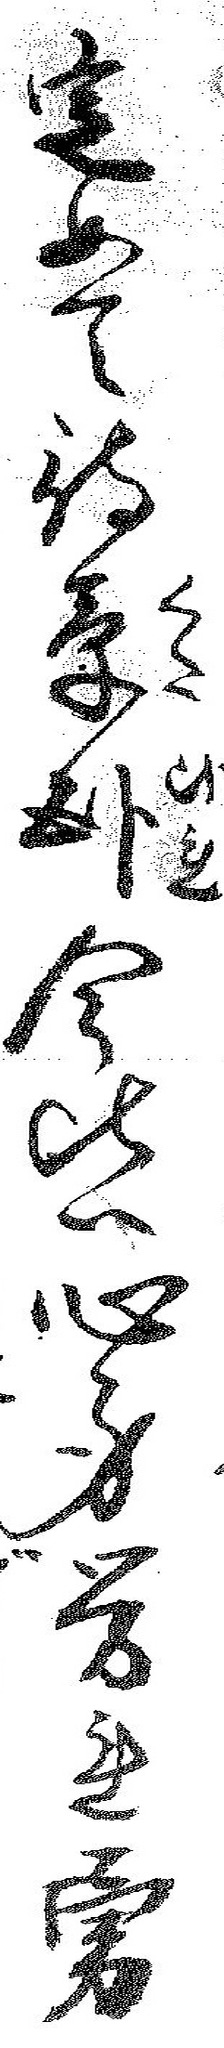定めて待草臥今比は心身労れ勇
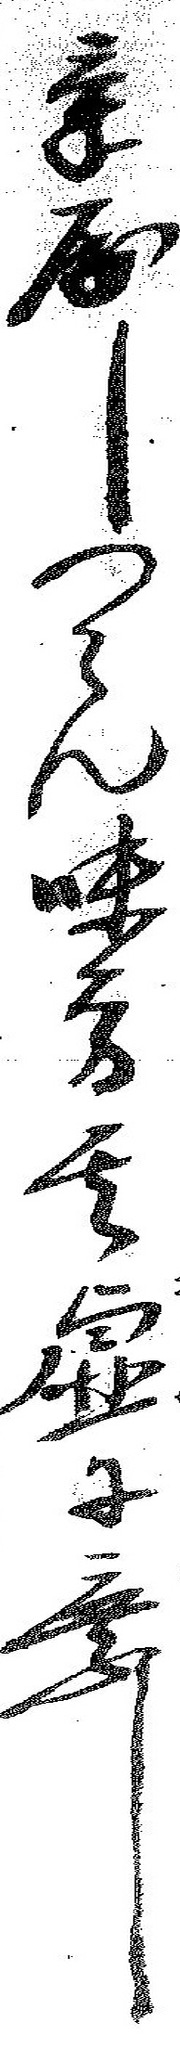気屈しつらん味方其虚に乗し
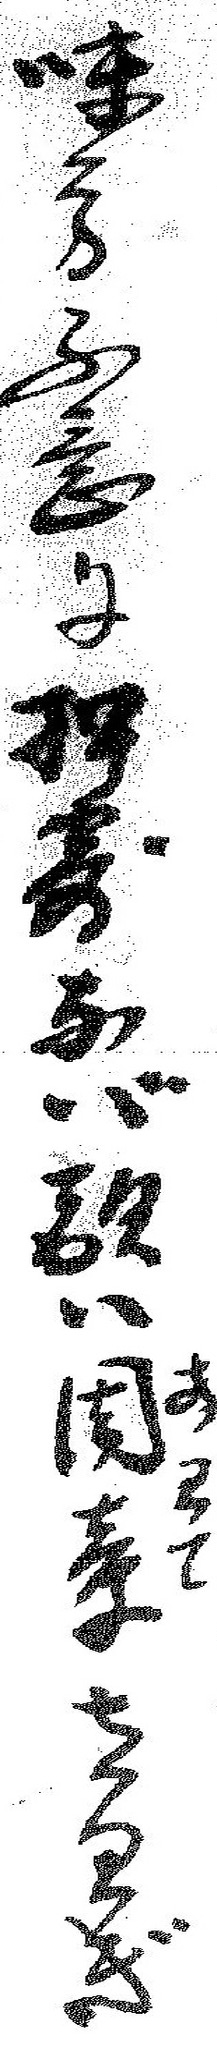味方不意に押寄なば敵は周章さわぎ
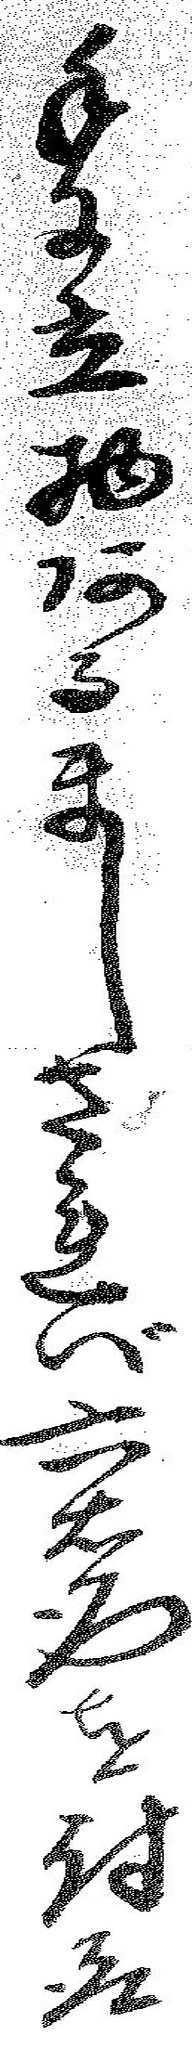手に立物あるましされば六右衛門を討取
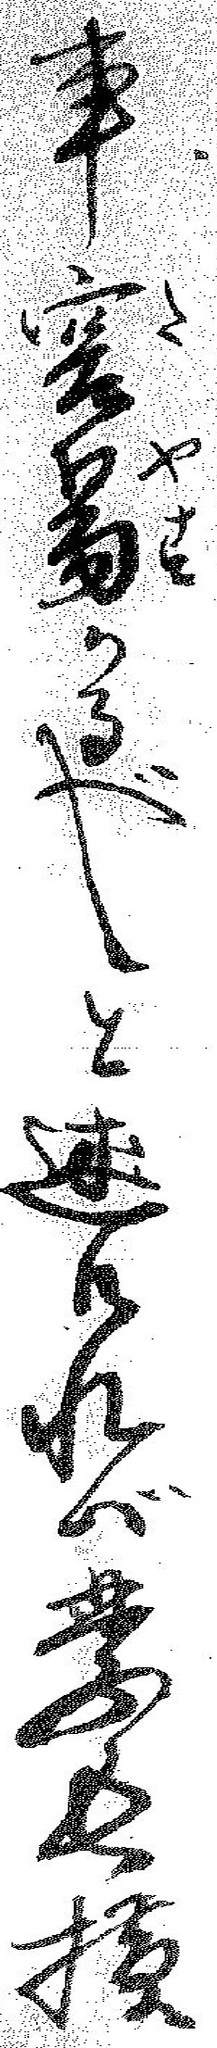事容易かるべしと述ければ禁長横
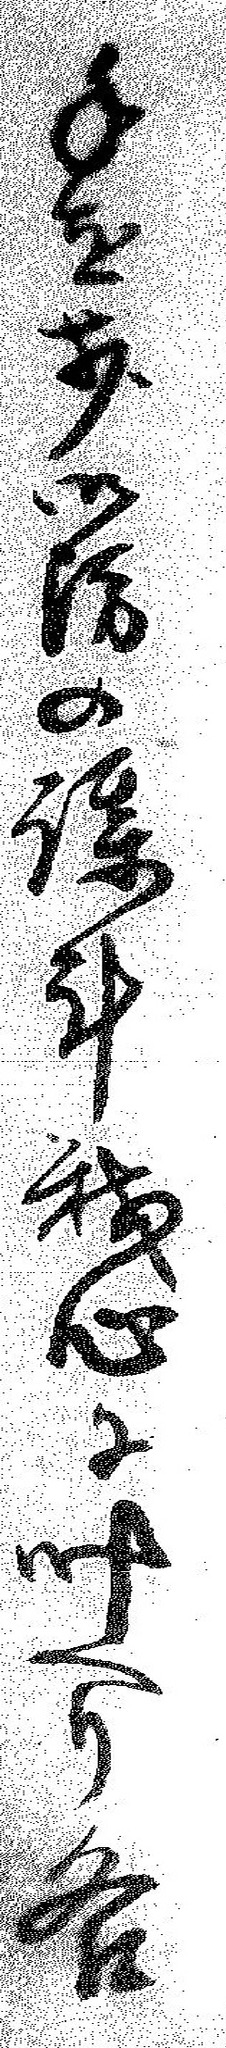手を打御坊の謀計我心に叶へり各
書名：近頃古狸珍説　礼義智信
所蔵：徳島県立図書館
